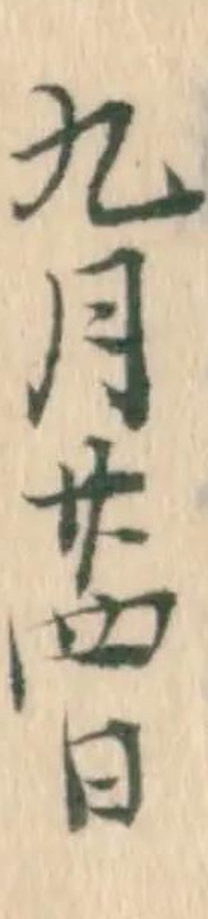八月十四日
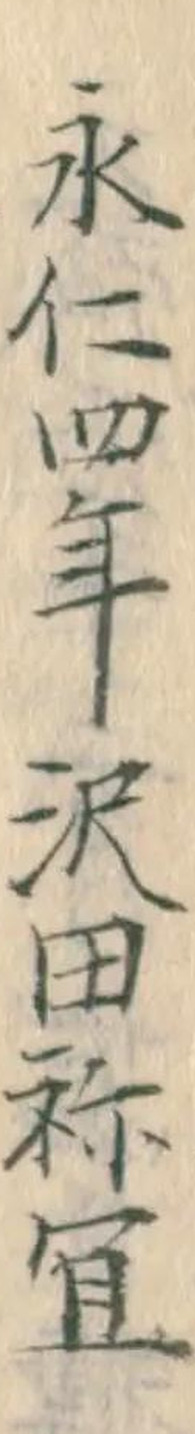永仁四年沢田祢宜
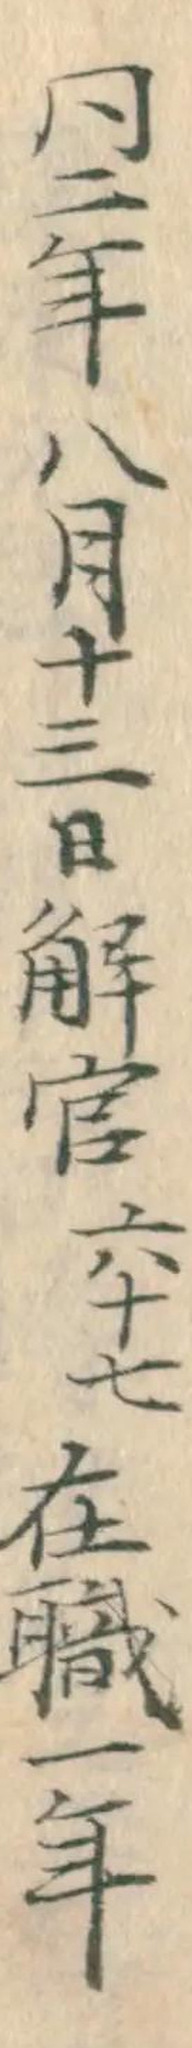同二年八月十三日解官六十七在職一年
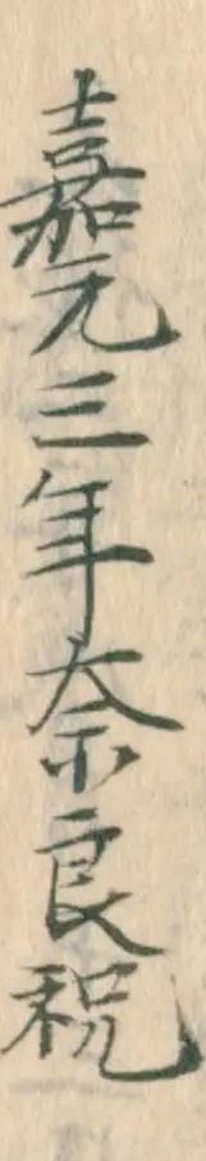嘉元三年転太田祝

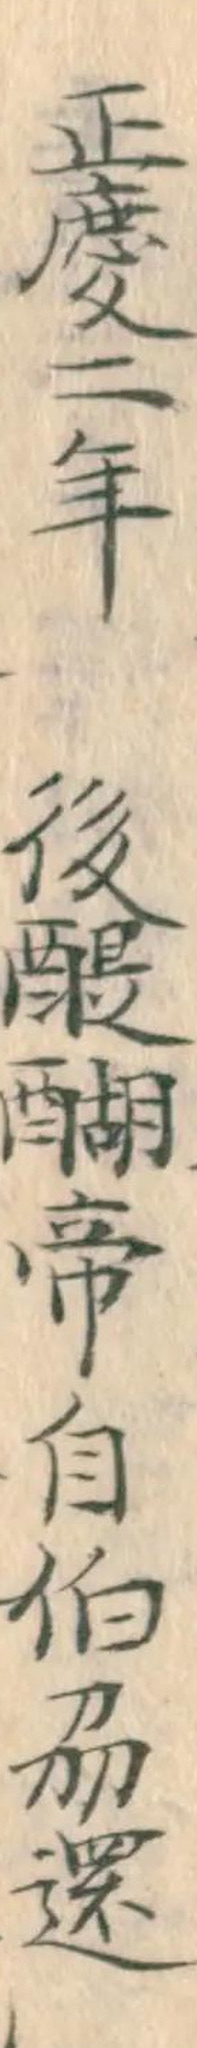正慶二年後醍醐帝自伯州還
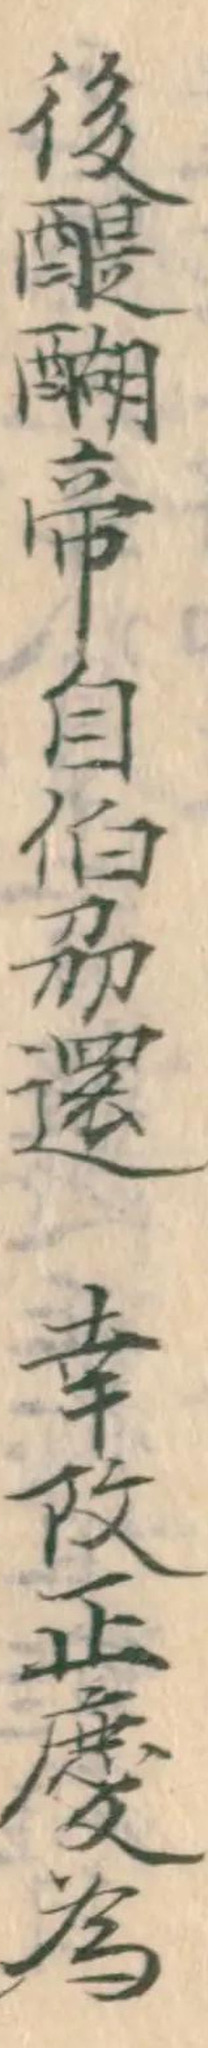信久後醍醐帝自伯州還幸改正慶為
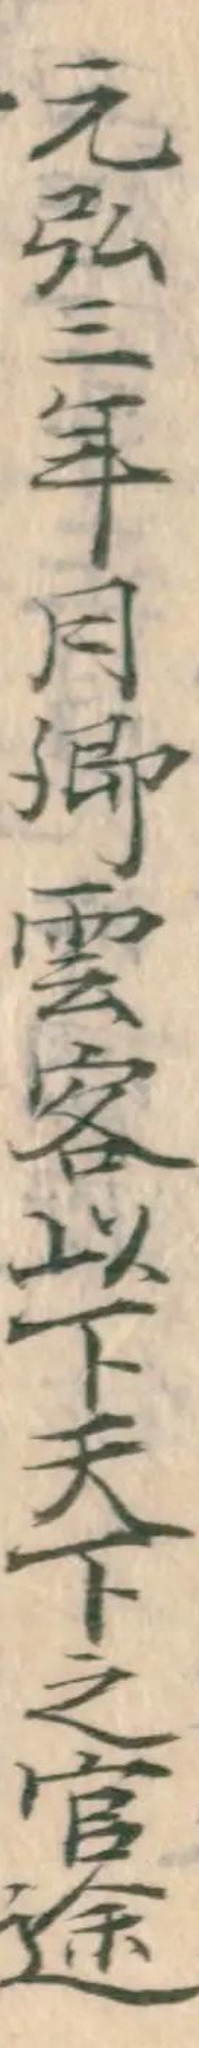元弘三年月卿雲客以下天下之官途
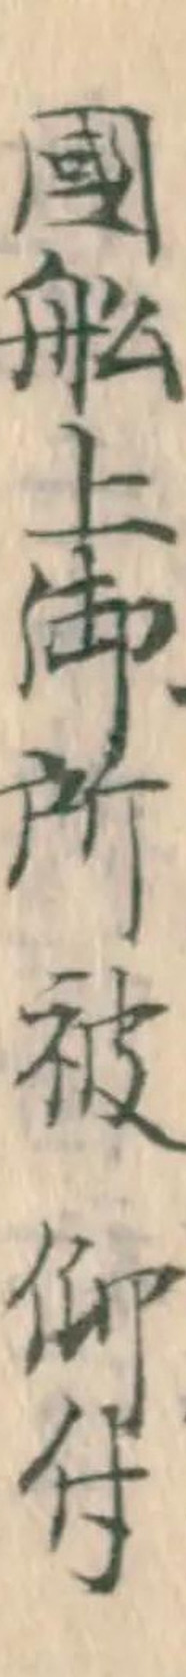国船上御所被仰付
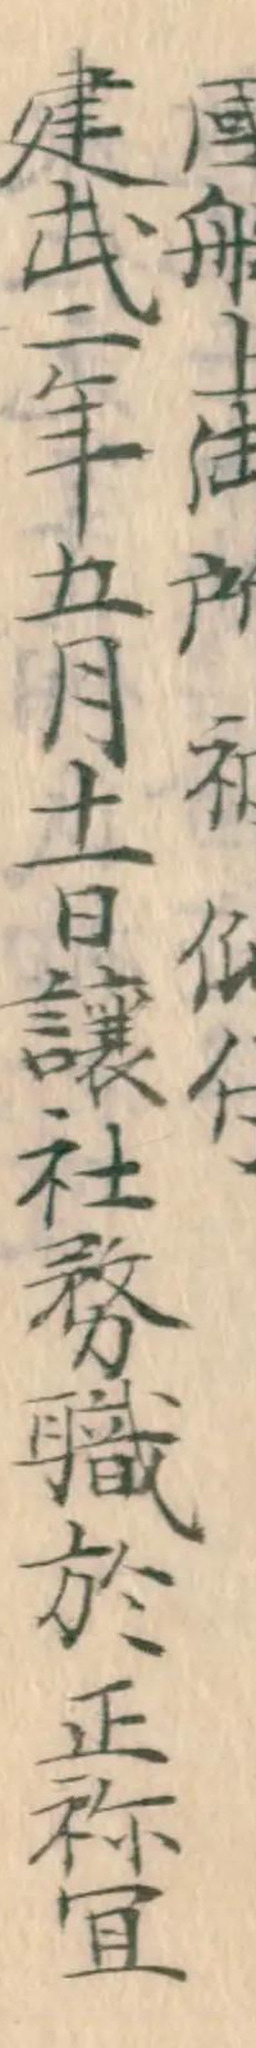建武二年五月十一日譲社務職於正祢宜
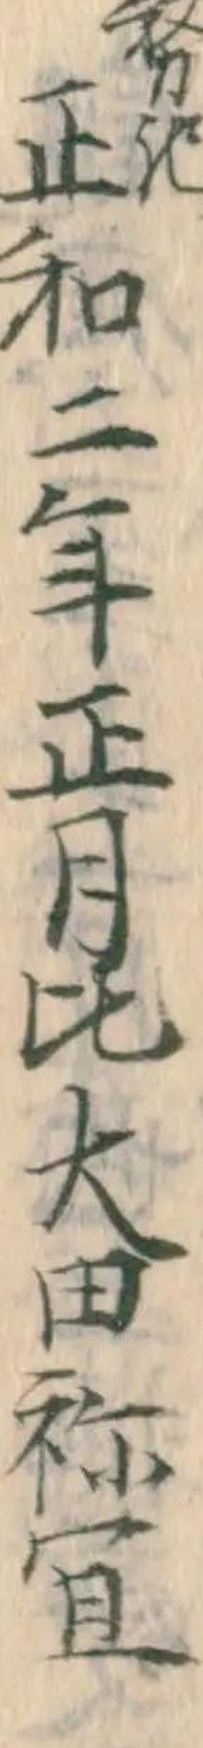正和二年正月比大田祢宜
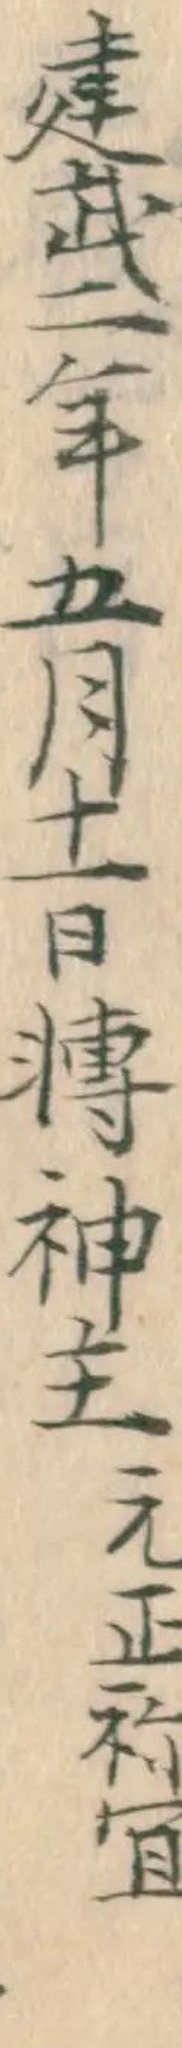建武二年五月十一日転神主元正祢宜
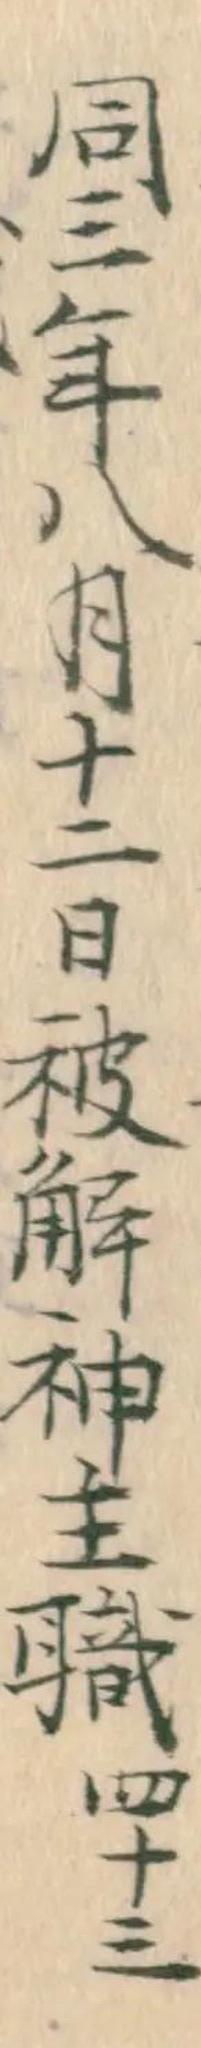同三年八月十日被解神主職四十三
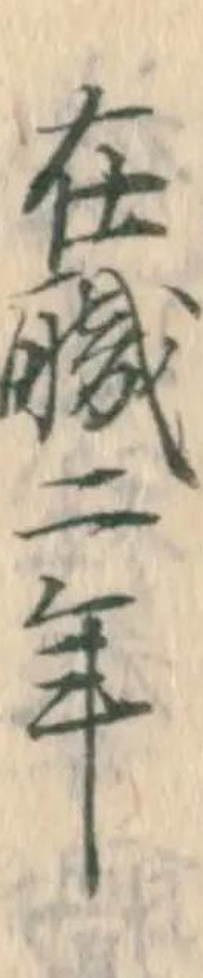在職二年
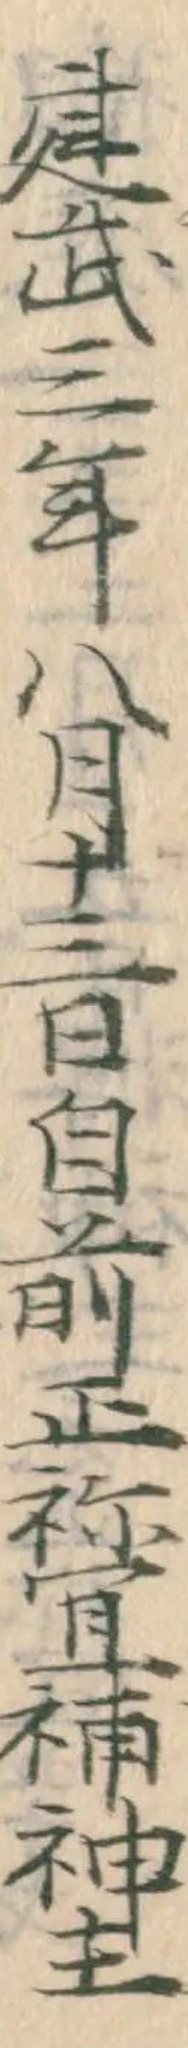建武三年八月十三日自前正祢宜補神主
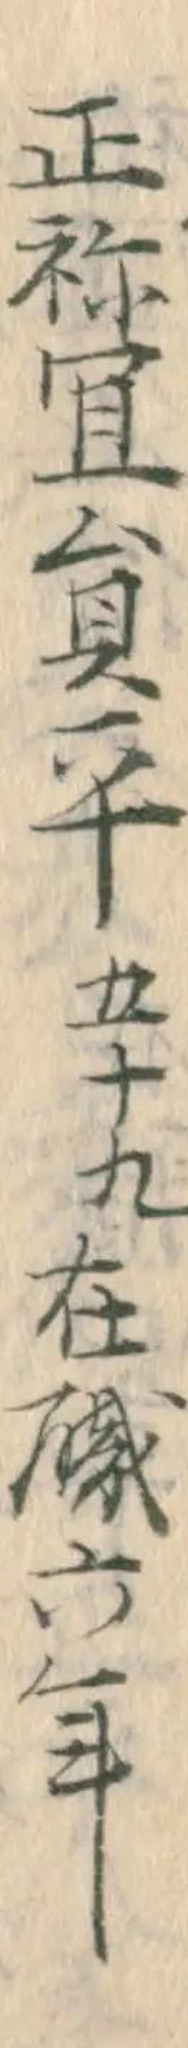正祢宜員平五十九在職六年
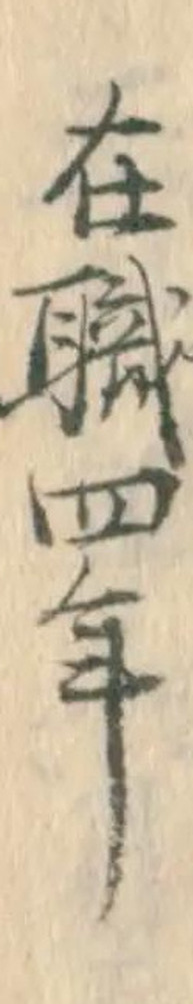在職二年
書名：賀茂社記録. 第23冊
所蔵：国立国会図書館 National Diet Library, JAPAN
